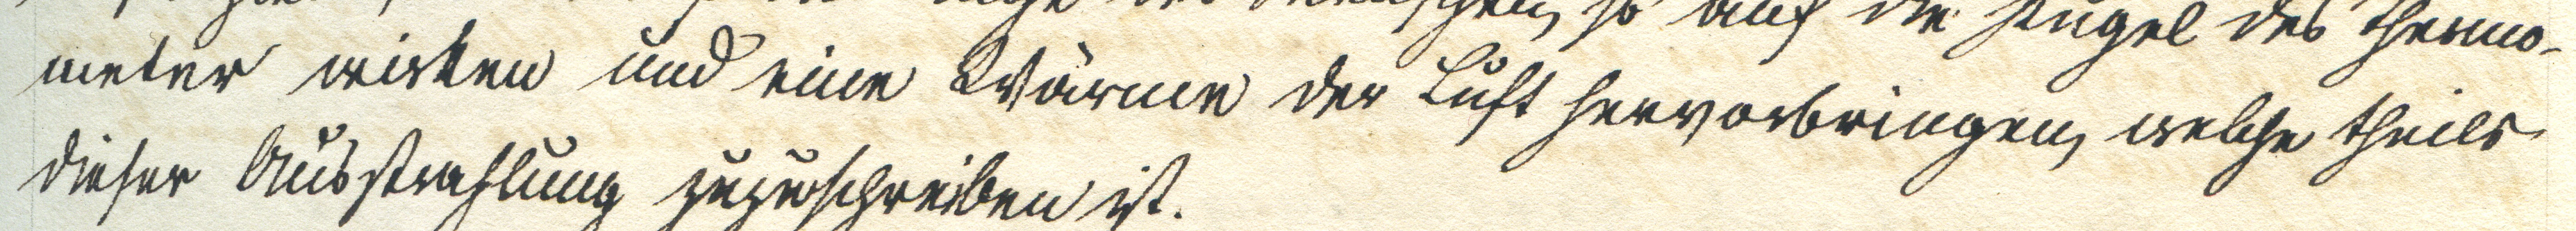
meter wirken und eine Wärme der Luft hervorbringen, welche theils
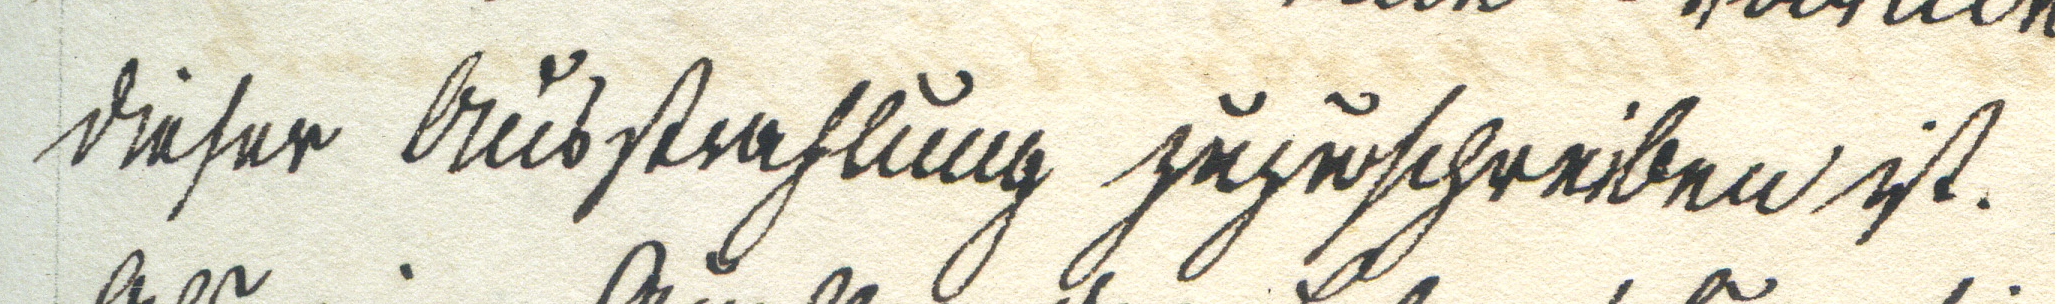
dieser Ausstrahlung zuzuschreiben ist.
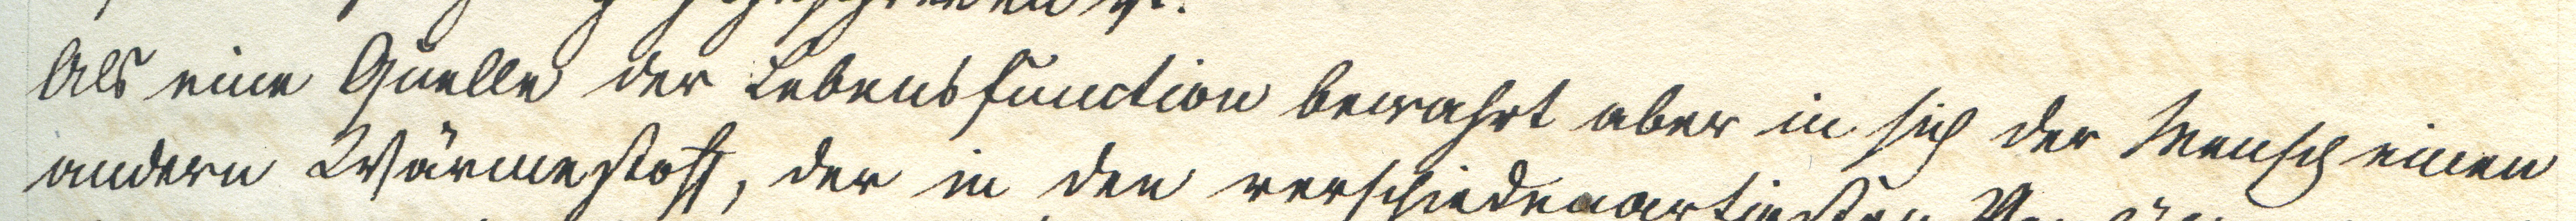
Als eine Quelle der Lebensfunction bewahrt aber in sich der Mensch einen
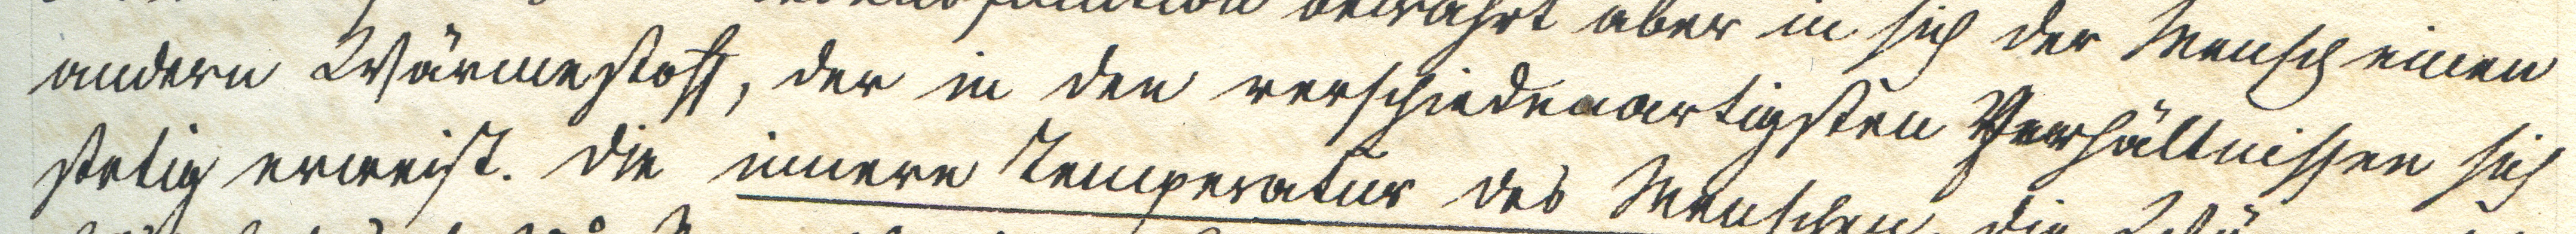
andern Wärmestoff, der in den verschiedenartigsten Verhältnissen sich
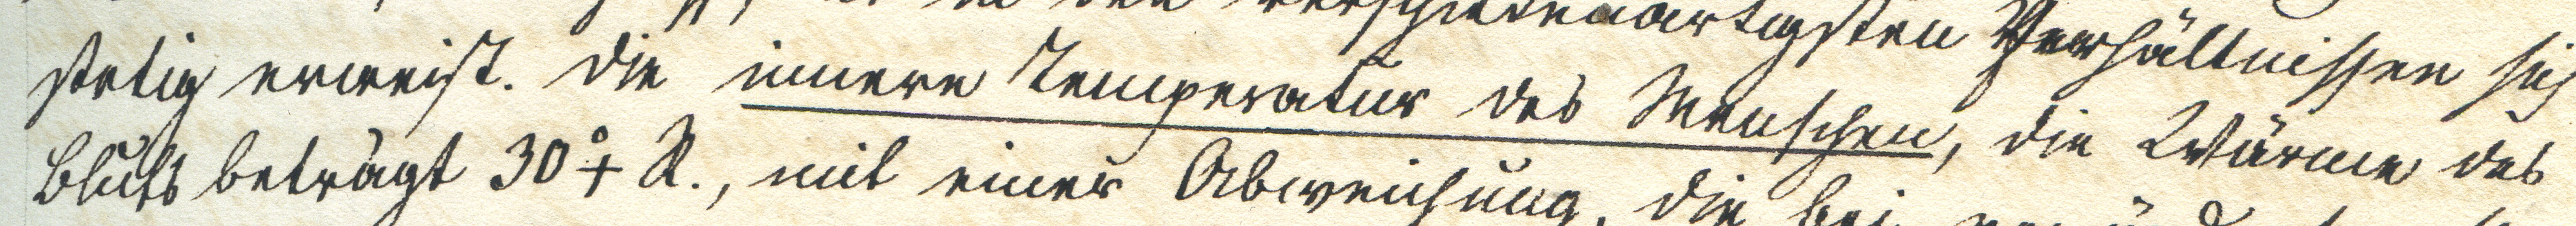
stetig erweist. Die innere Temperatur des Menschen, die Wärme des
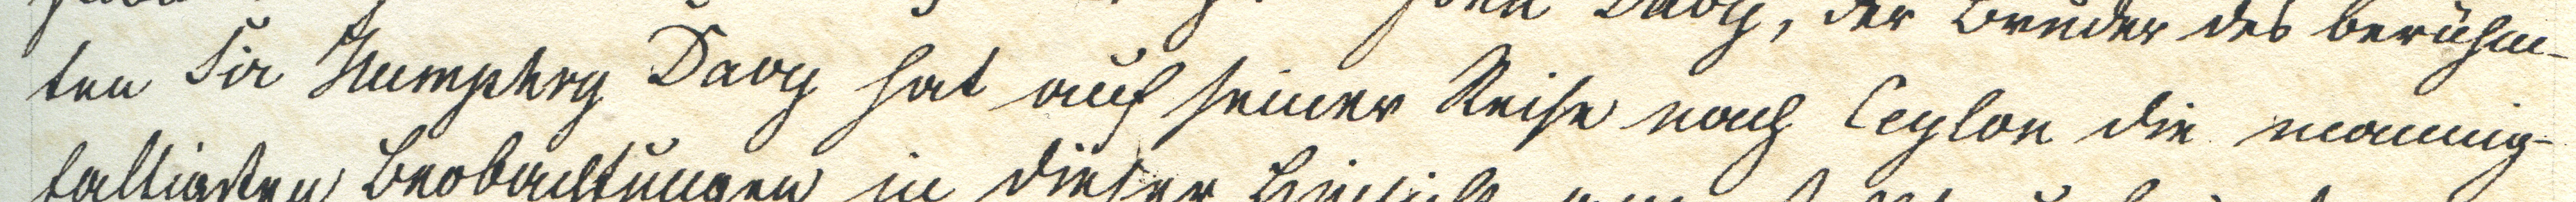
ten Sir Humphry Davy hat auf seiner Reise nach Ceylon die mannig-
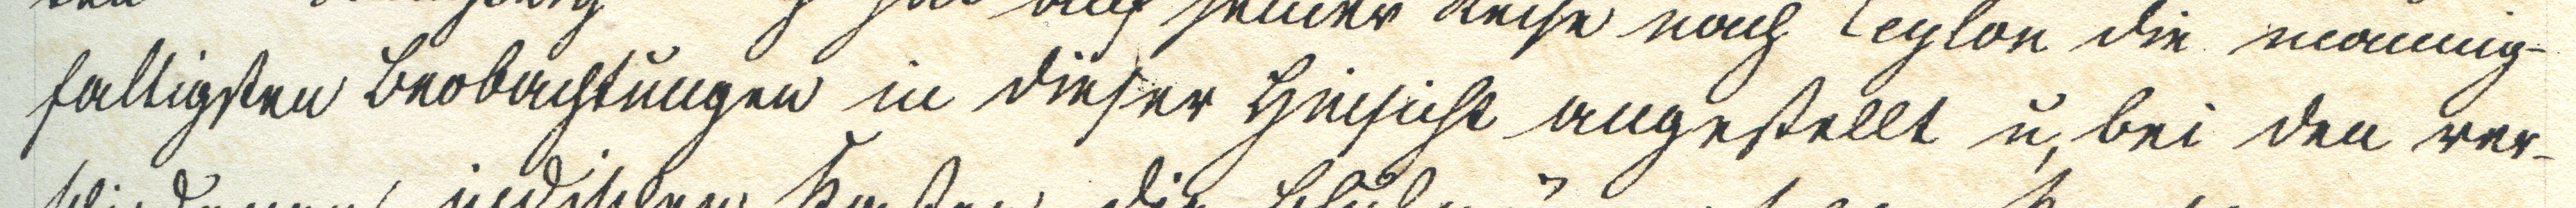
faltigsten Beobachtungen in dieser Hinsicht angestellt u, bei den ver-
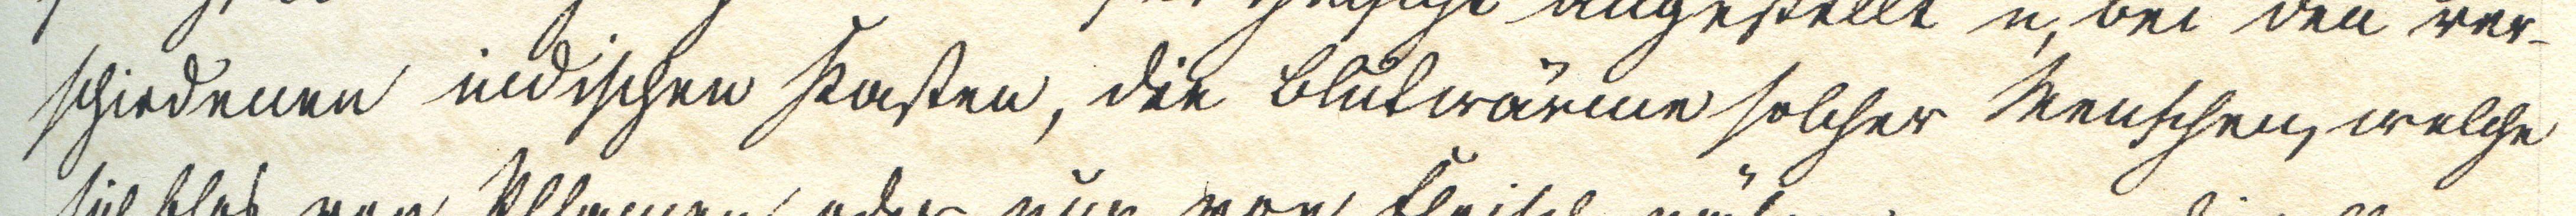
schiedenen indischen Kasten, die Blutwärme solcher Menschen, welche
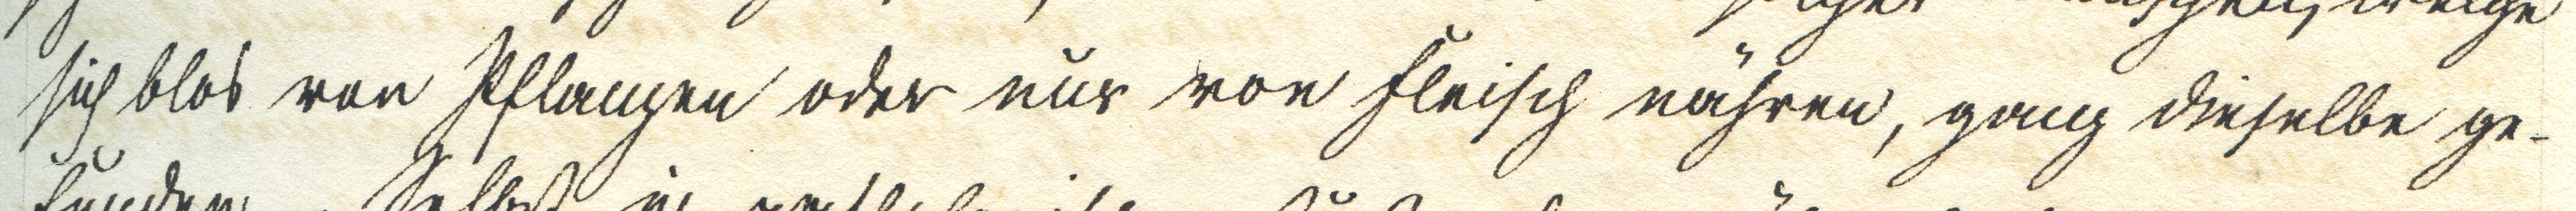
sich bloß von Pflanzen oder nur von Fleisch nähren, ganz dieselbe ge-
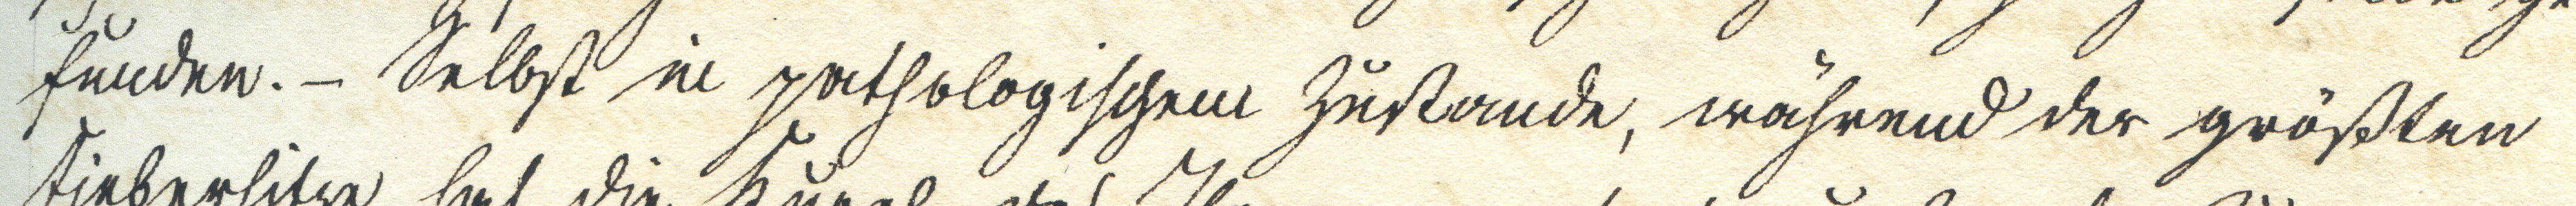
funden. – Selbst in pathologischem Zustande, während der größten
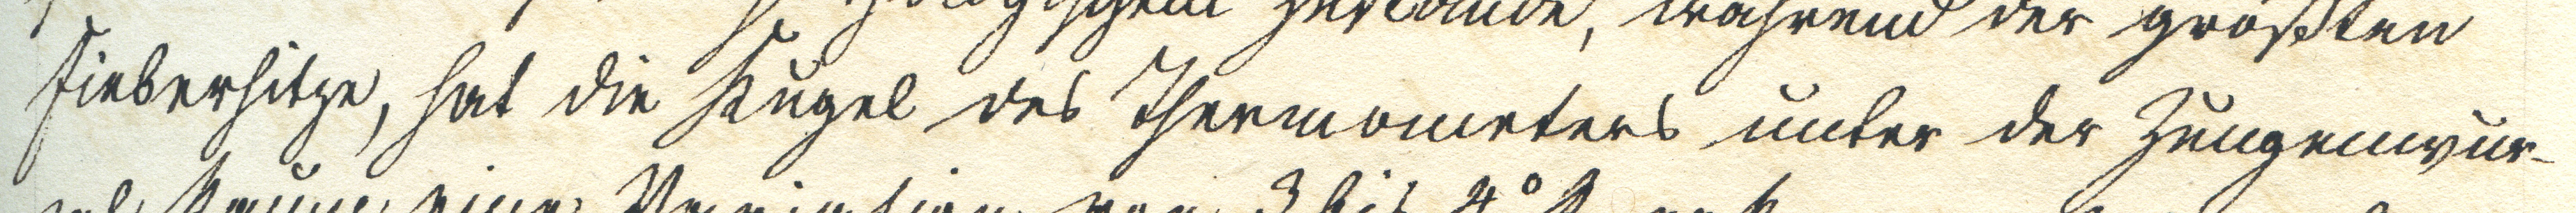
Fieberhitze, hat die Kugel des Thermometers unter der Zungenwur-
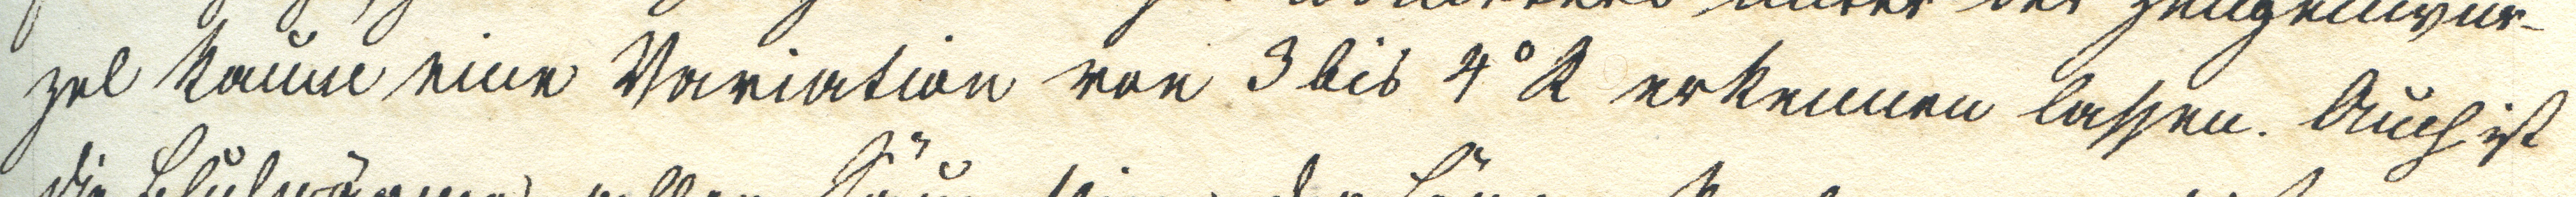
zel kaum eine Variation von 3 bis 4° R erkennen lassen. Auch ist
